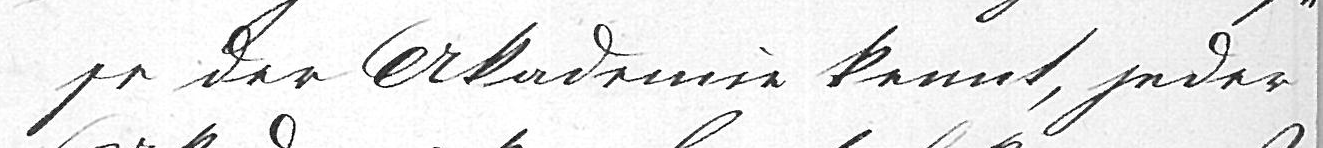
se der Akademie kennt, jeder
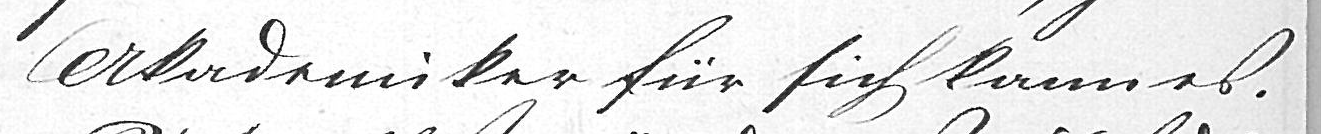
Akademiker für sich kann es.
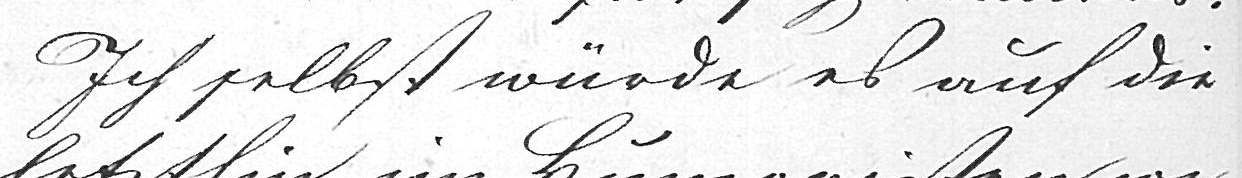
Ich selbst würde es auf die
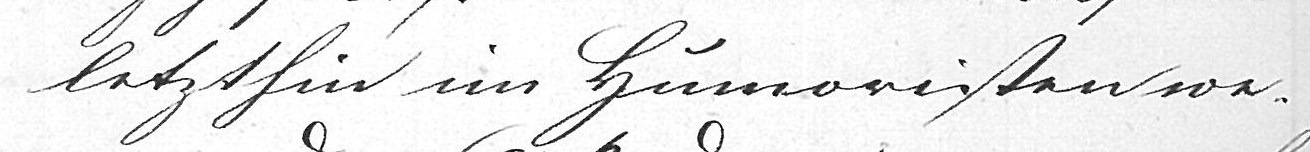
letzthin und Humoristen we-
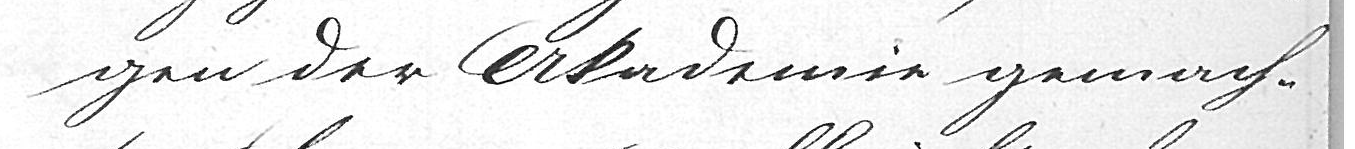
gen der Akademie gemach-
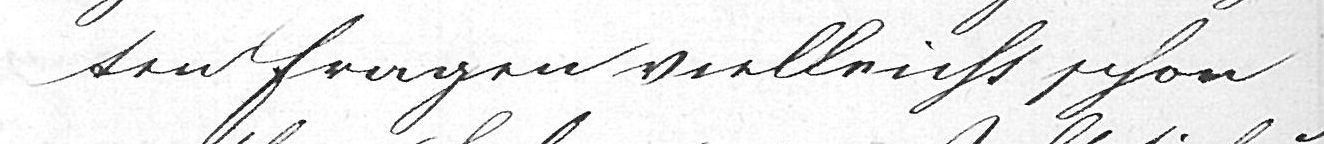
ten Fragen vielleicht schon
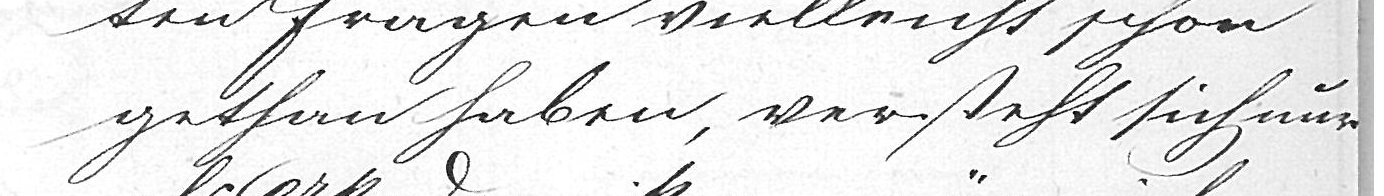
gethan haben, versteht sicher nur
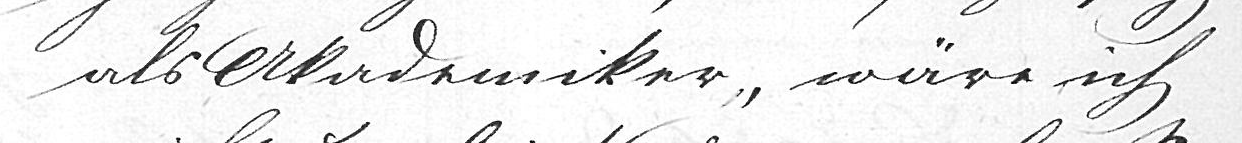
als Akademiker, wäre ich
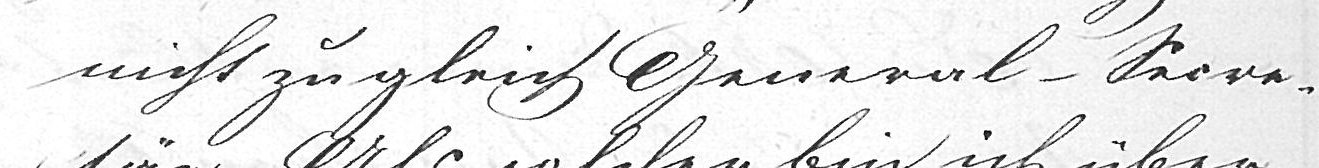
nicht zu gleich General-Secre-
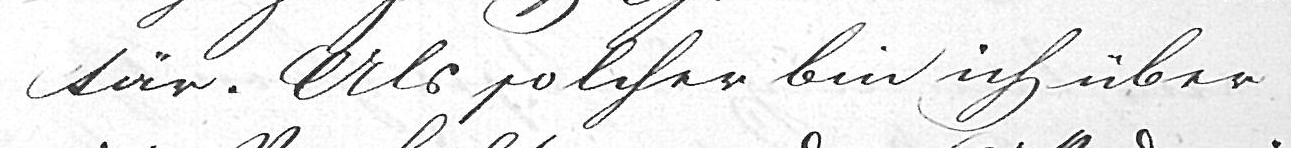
tär. Als solcher bin ich über
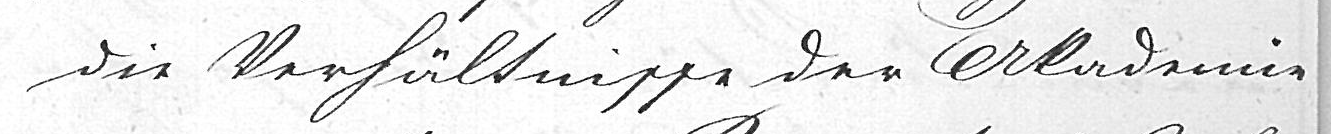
die Verhältnisse der Akademie
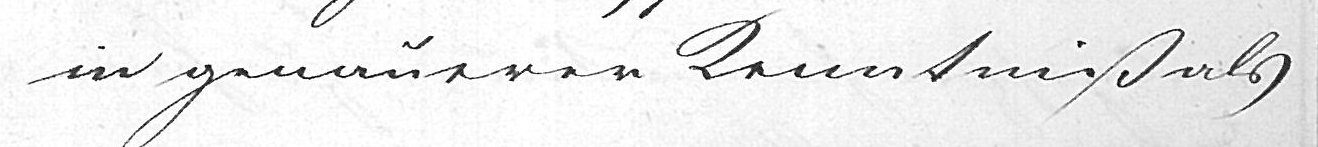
in genauerer Kenntniß als
